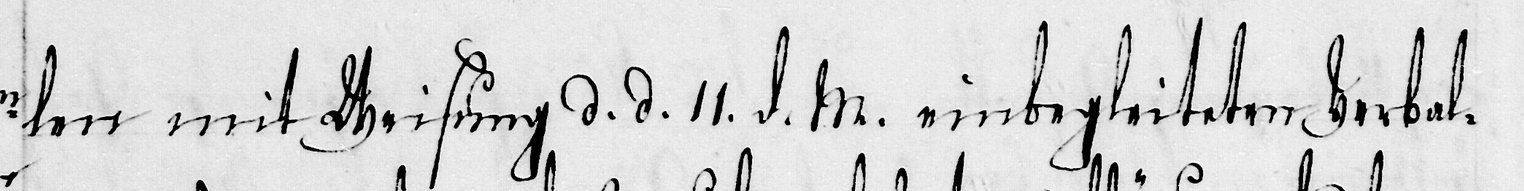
len mit Weisung d. d. 11. d. M. einbegleiteten Verbal¬
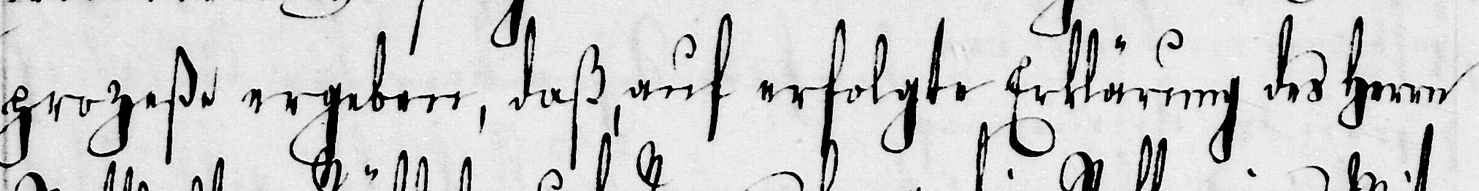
prozeße ergeben, daß, auf erfolgte Erklärung des Herrn
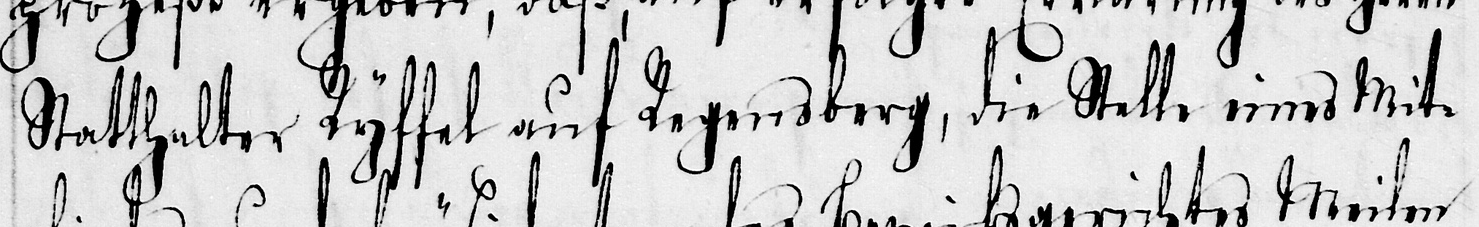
Statthalter Ryffel auf Regensberg, die Stelle eines Mit¬
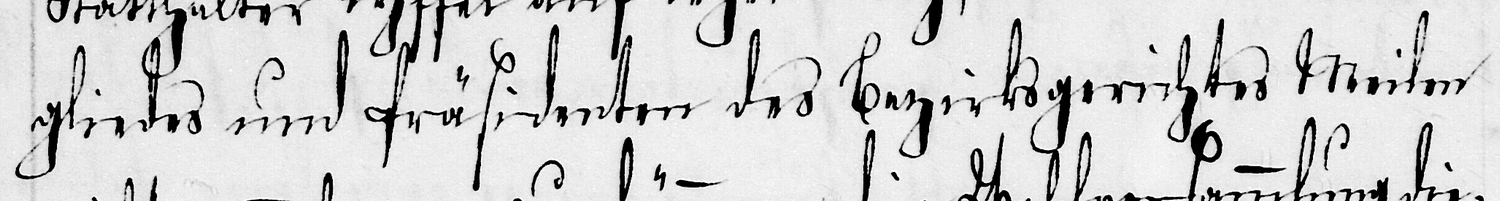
gliedes und Präsidenten des Bezirksgerichtes Meilen
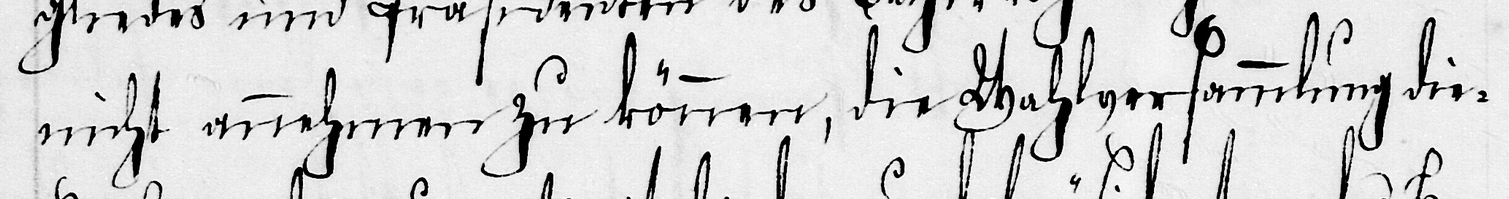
nicht annehmen zu können, die Wahlversammlung die¬
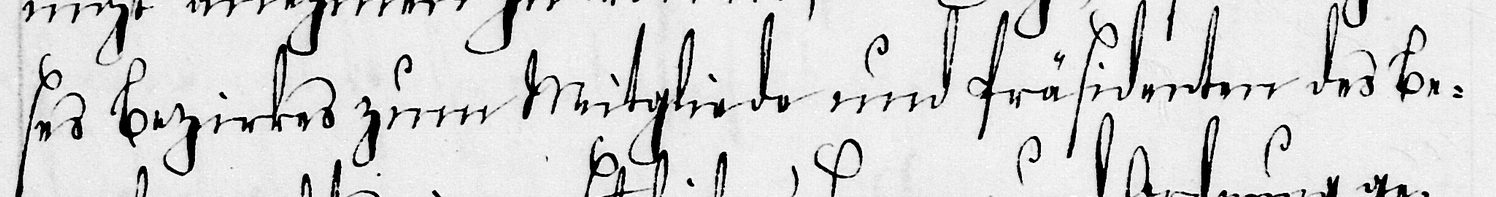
ses Bezirkes zum Mitgliede und Präsidenten des Be¬
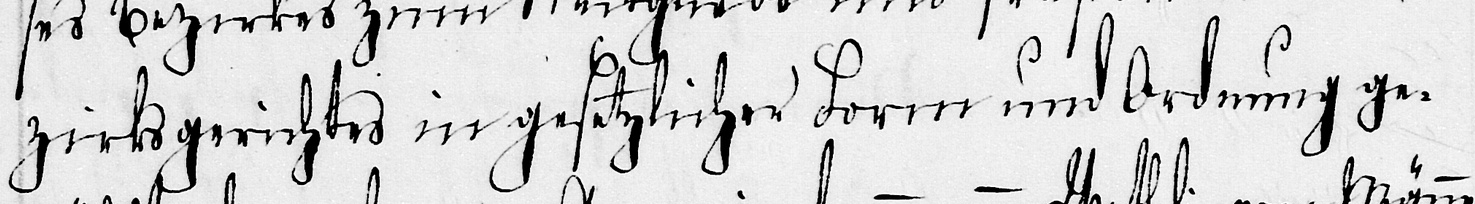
zirksgerichtes in gesetzlicher Form und Ordnung ge¬
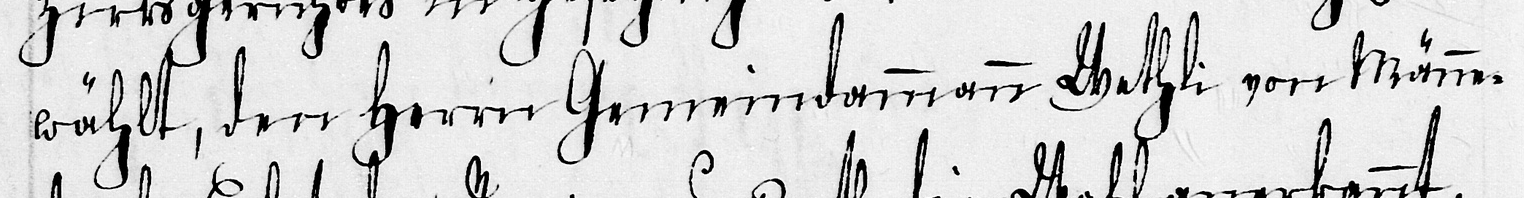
wählt, den Herrn Gemeindammann Wethli von Männe¬
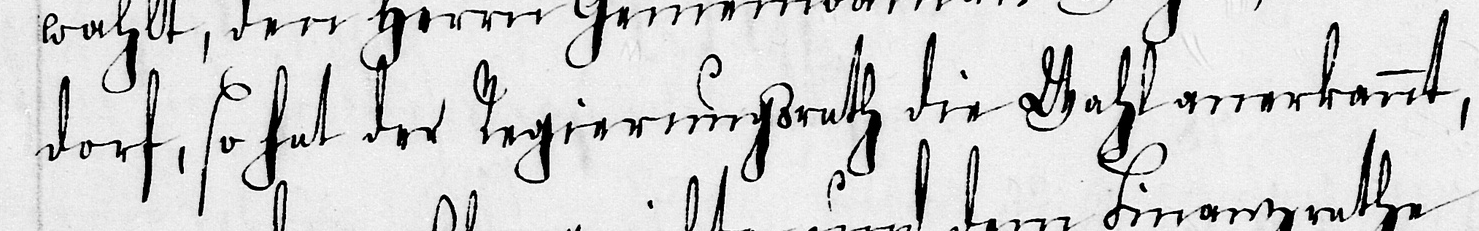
dorf, so hat der Regierungsrath die Wahl anerkannt,
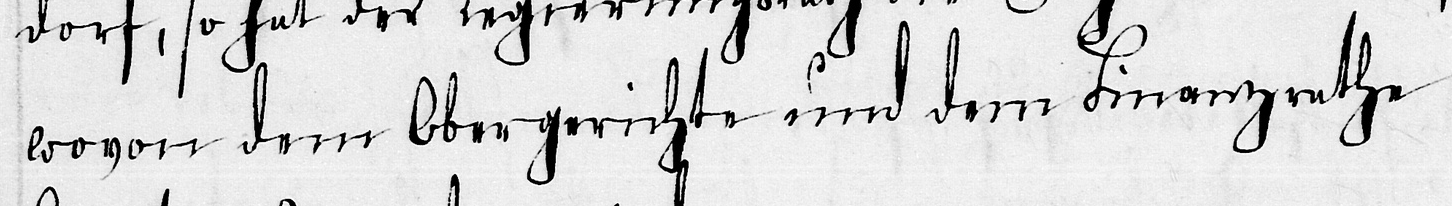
wovon dem Obergerichte und dem Finanzrathe
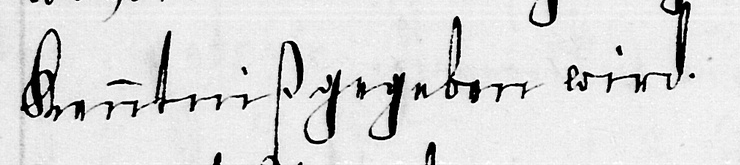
Kenntniß gegeben wird.
